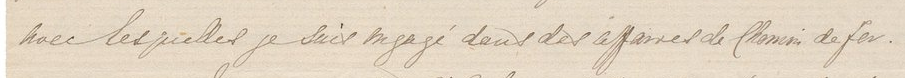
avec lesquelles je suis engagé dans des affaires de Chemin de fer.
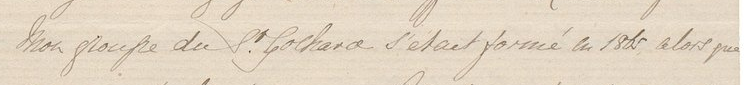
Mon groupe du St Gothard s'étant formé en 1865, alors que
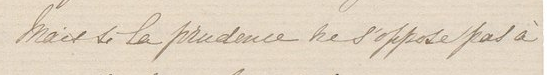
Mais si la prudence ne s'oppose pas à
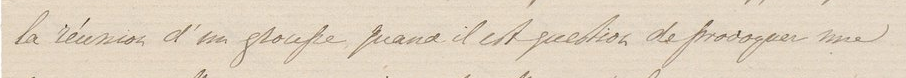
la réunion d'un groupe, quand il est question de provoquer une
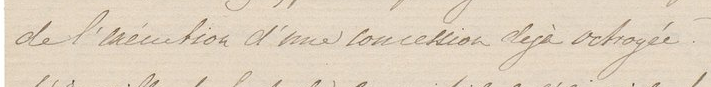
de l'exécution d'une concession dejà octroyée.
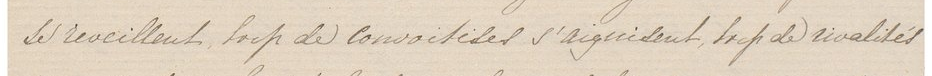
se reveillent, trop de convoitises s'aiguisent, trop de rivalités
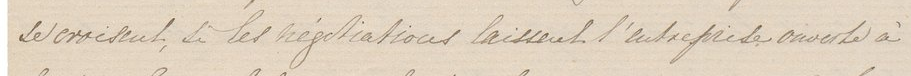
se croisent, si les négotiations laissent l'entreprise ouverte à
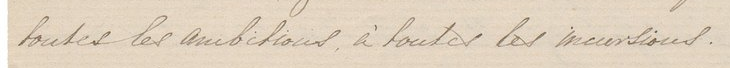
toutes les ambitions, à toutes les incursions.
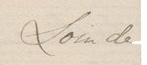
Loin de
